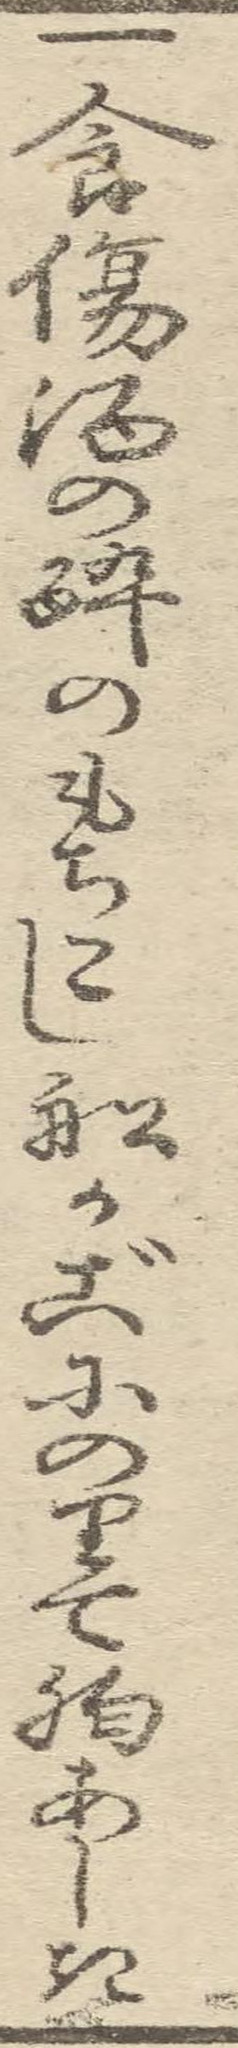一食傷酒の酔のもちこし船かごにのりて胸あしき
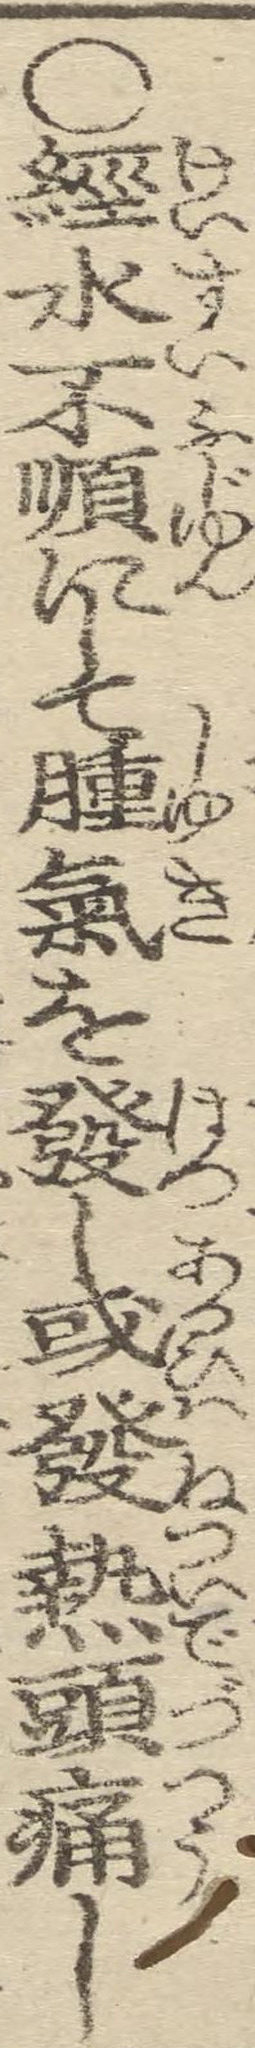○経水不順にして腫気を発し或発熱頭痛し
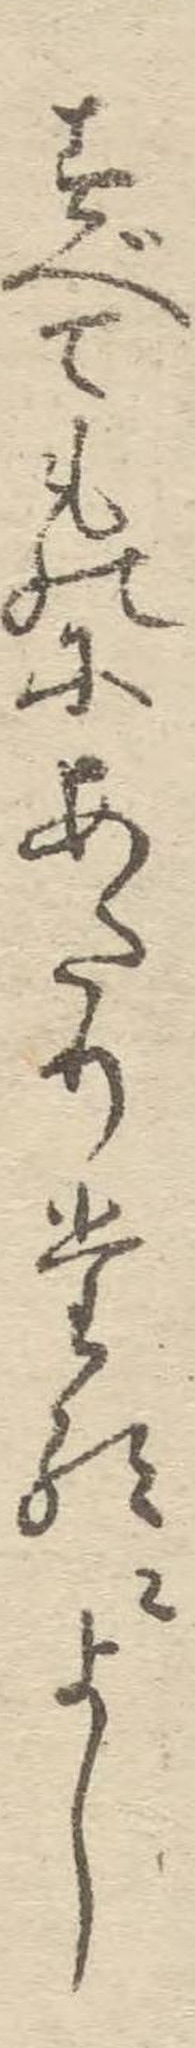すべてものにあたりたるニよし
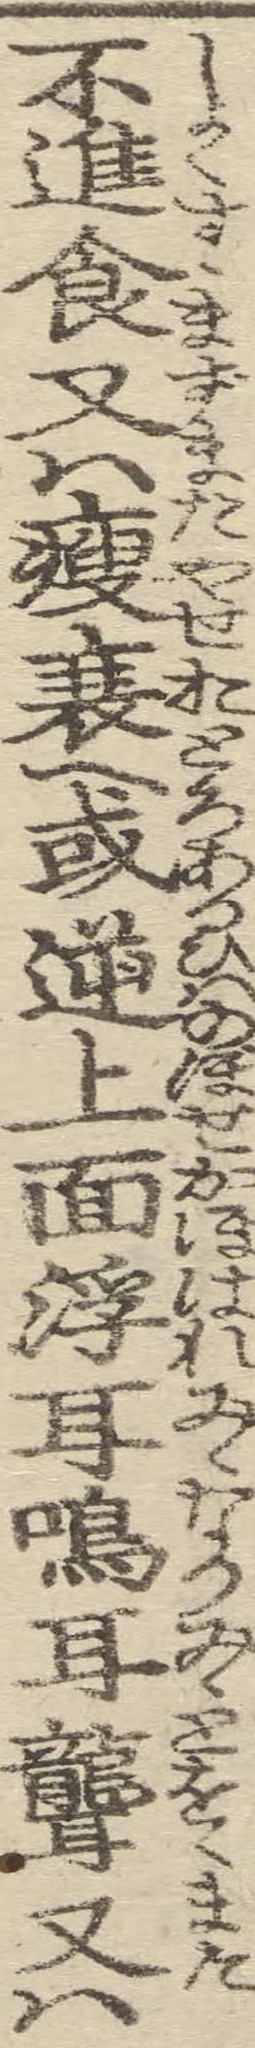不進食又は痩衰へ或逆上面浮耳鳴耳聾又は
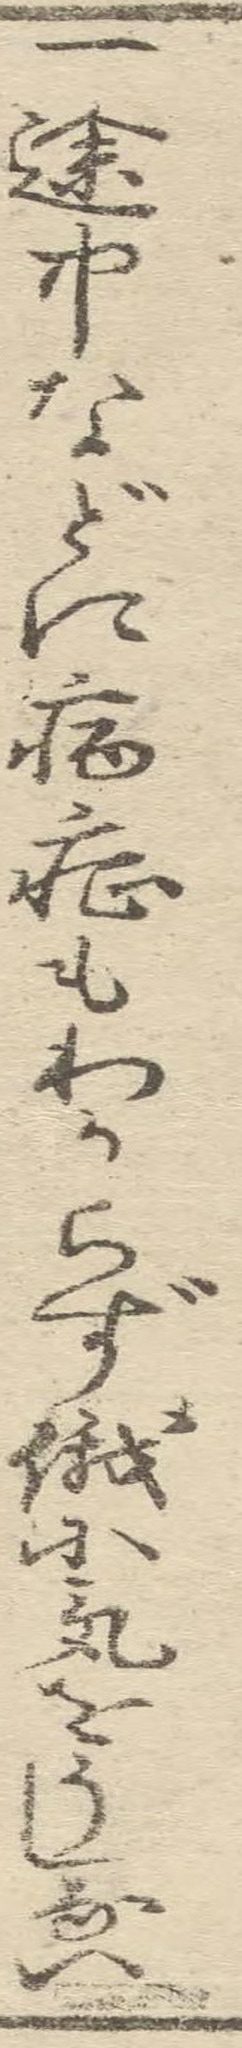一途中などに病症もわからず俄に気をうしない
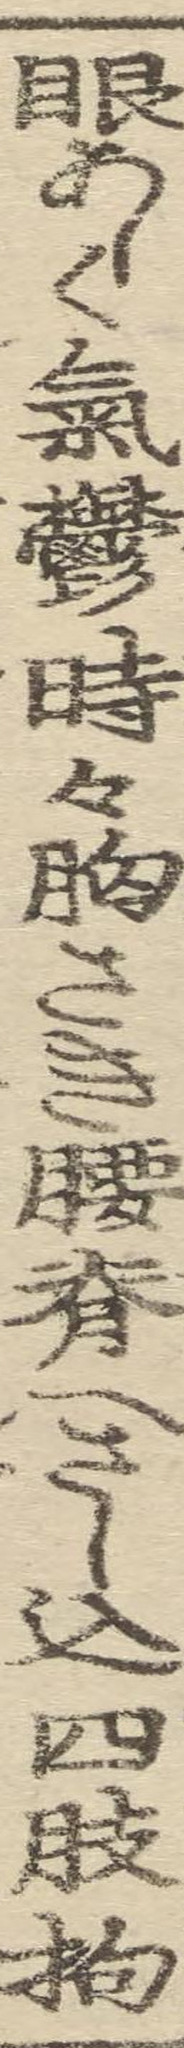眼あしく気鬱時々胸さき腰脊へさし込四肢拘
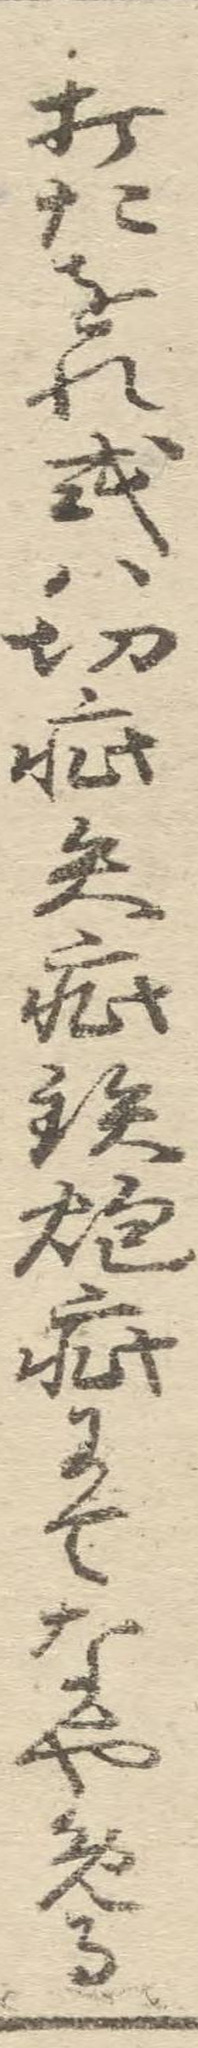打たをれ或は切疵矢疵鉄炮疵にてなやめる
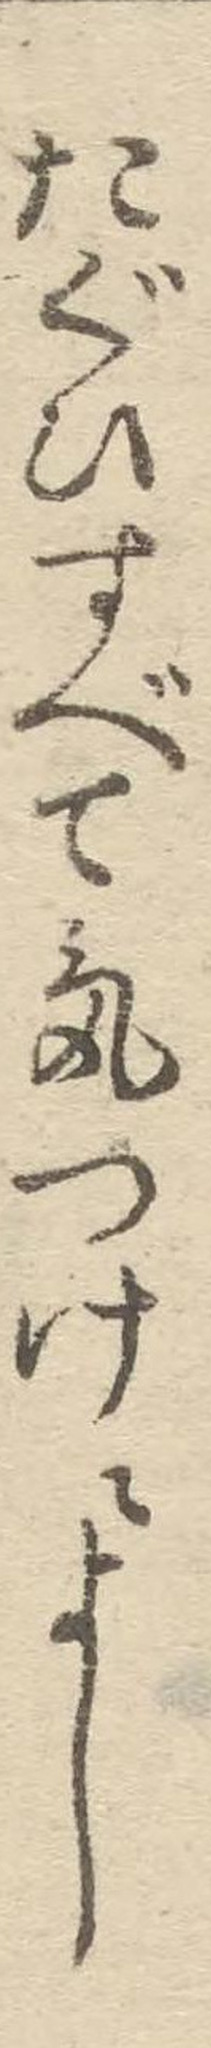たぐひすべて気つけニよし
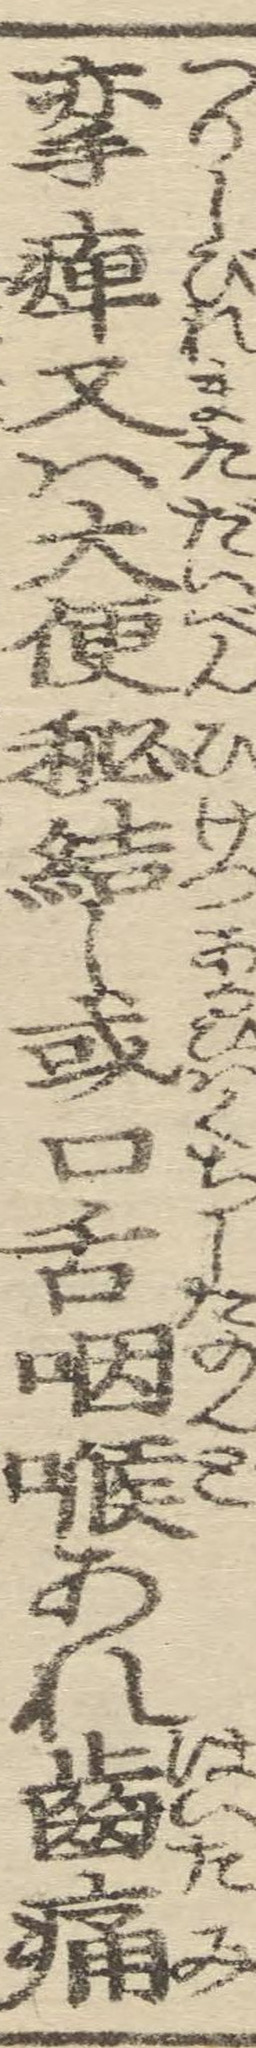攣痺又は大便秘結し或口舌咽喉あれ歯痛
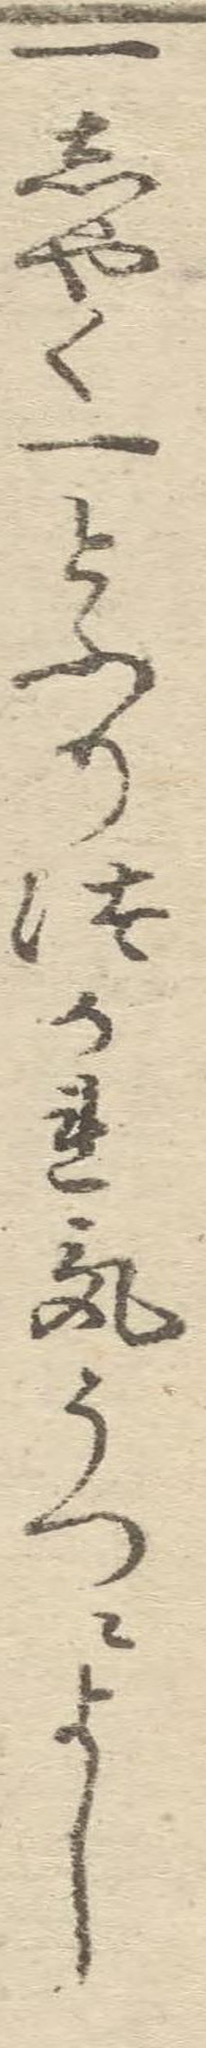一しやく一とふりつかれ気うつニよし
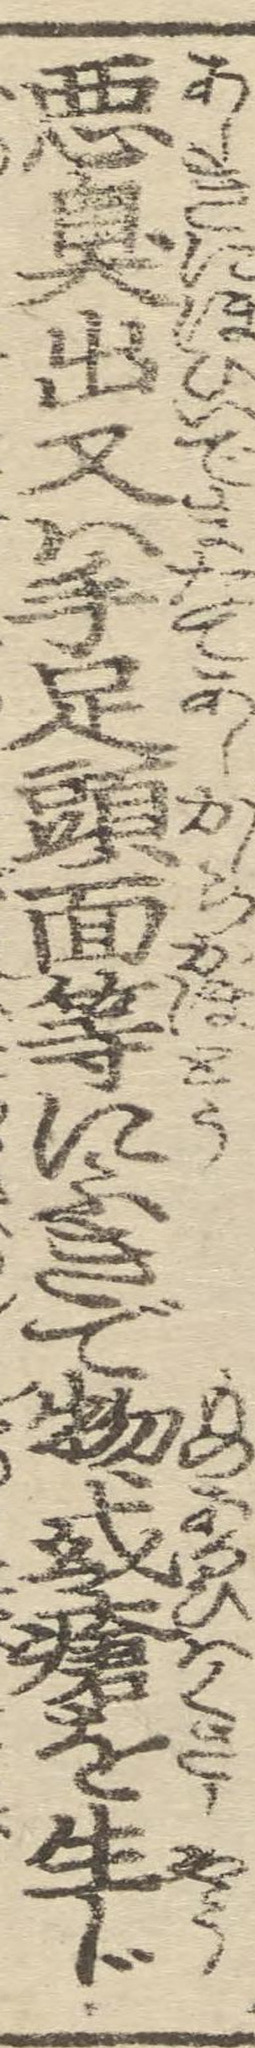悪臭出又は手足頭面等にふきで物或瘡を生じ
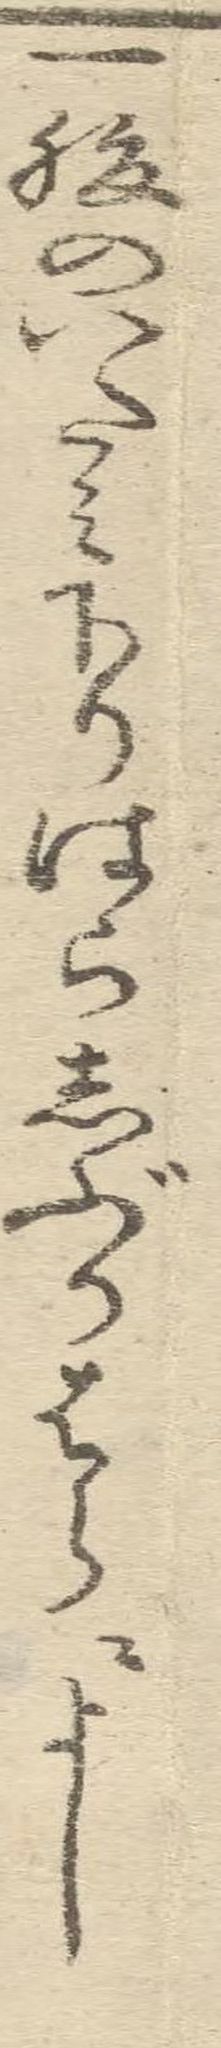一腹のいたみ下りはらしぶりはらニよし
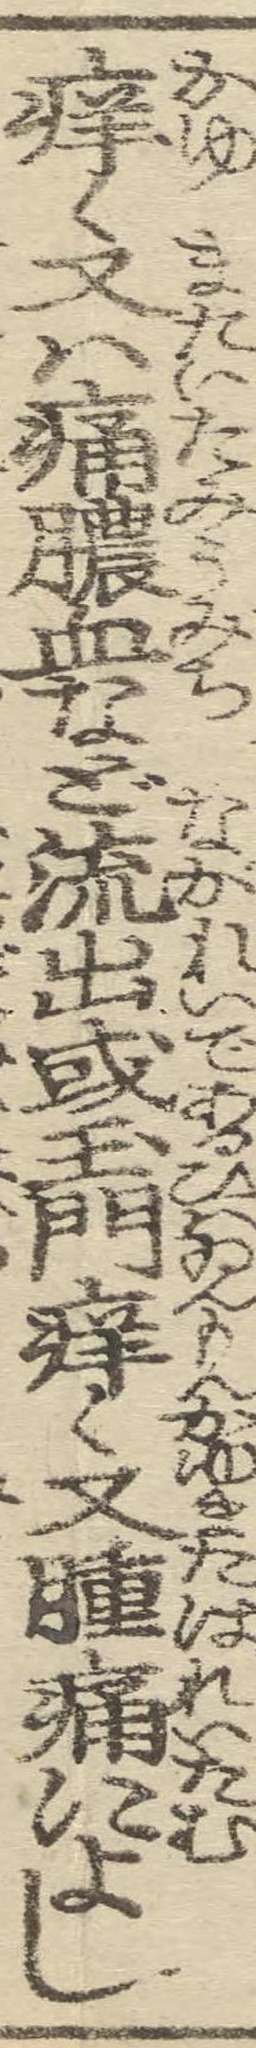痒く又は痛膿血など流出或玉門痒く又腫痛によし
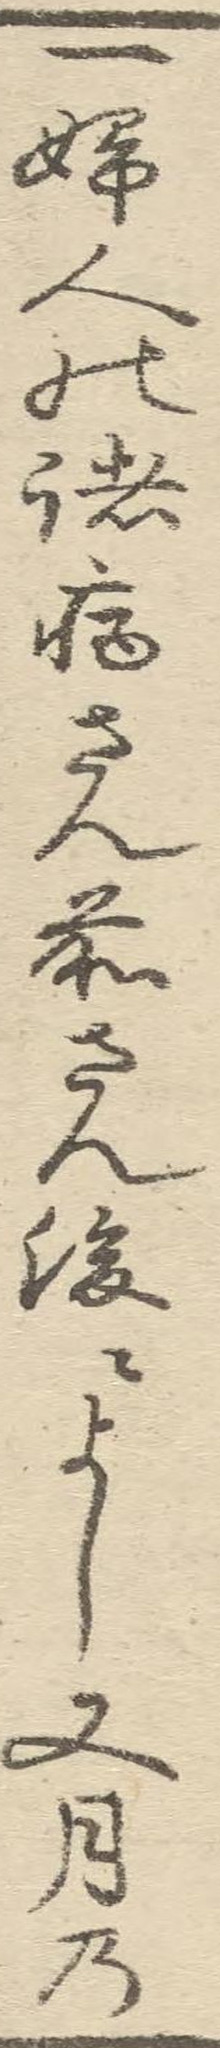一婦人の諸病さん前さん後ニよし又月の
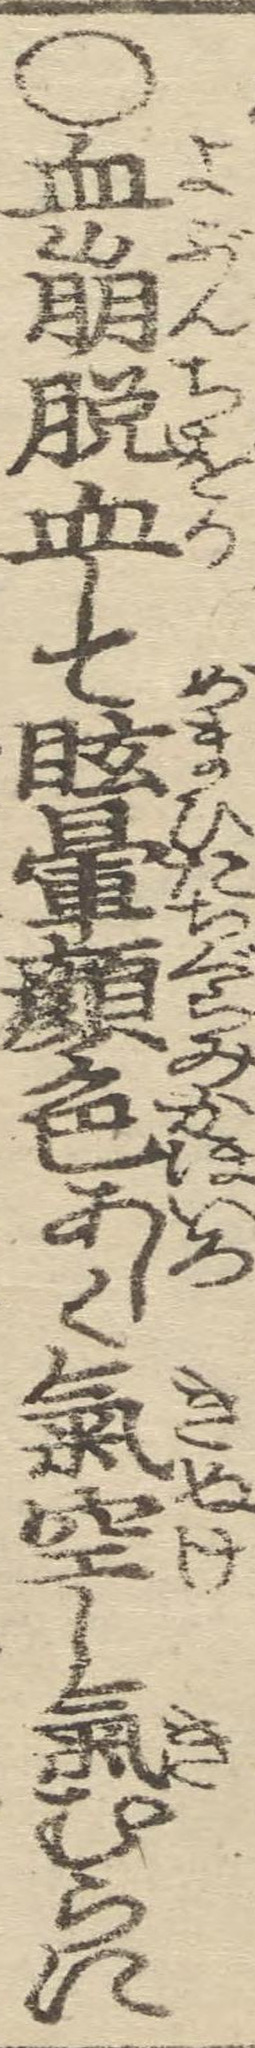○血崩脱血して眩暈顔色あしく気空し気むらに
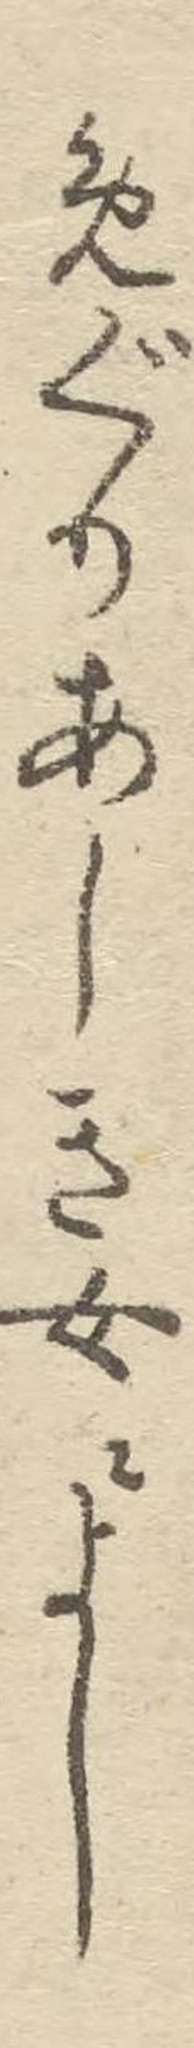めぐりあしき女ニよし
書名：浪華薬種問屋能書張交帖. 二
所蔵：国立国会図書館 National Diet Library, JAPAN
